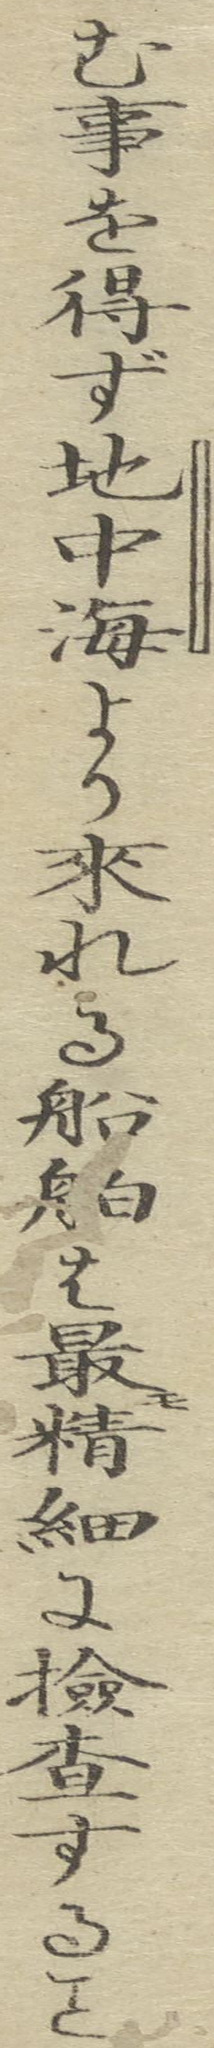む事を得ず地中海より來れる船舶は最精細に撿査すること

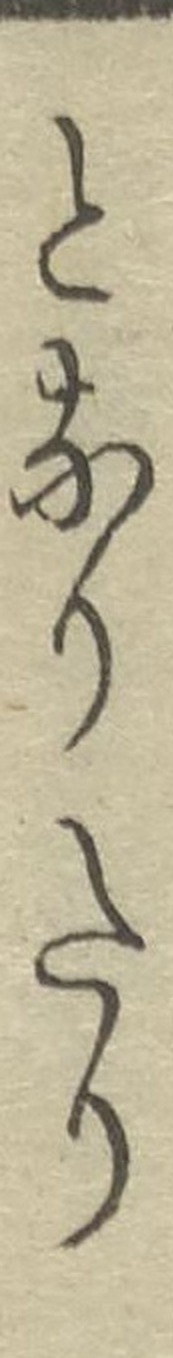となりたり
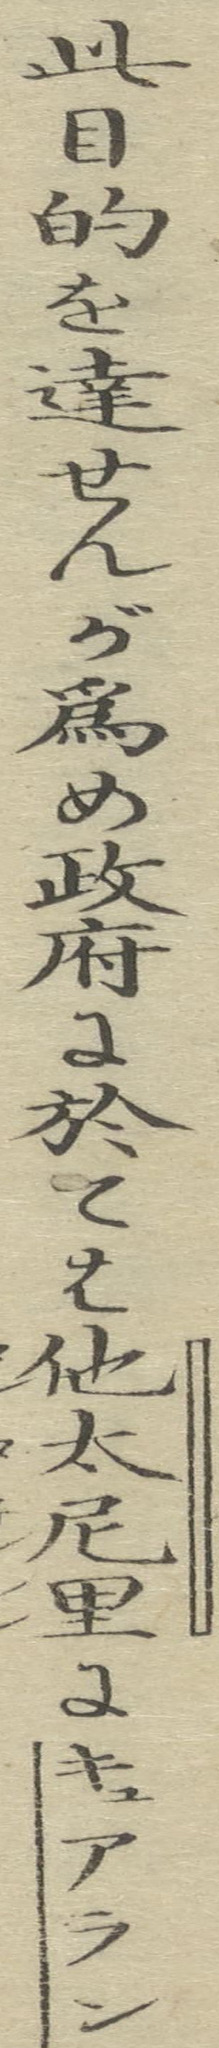此目的を達せんが為め政府に於ては他太尼里にキュアラン
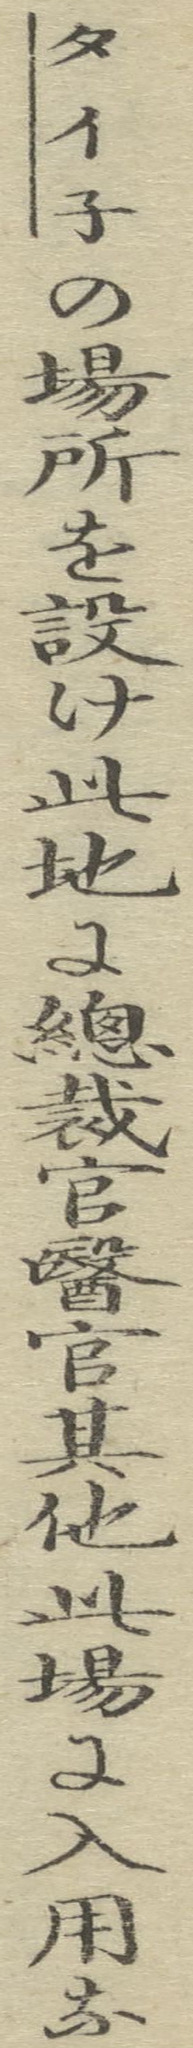タイネの場所を設け此地に總裁官醫官其他此場に入用な
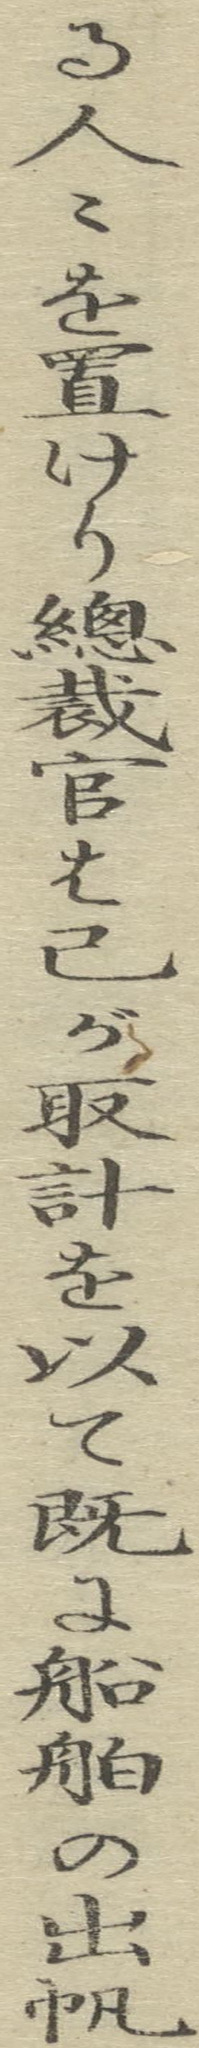る人々を置けり總裁官は己が取計を以て既に船舶の出帆
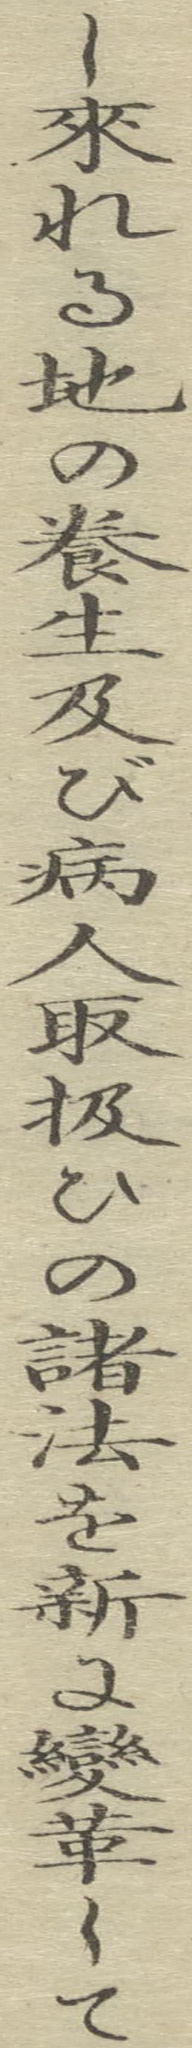し來れる地の養生及び病人取扱ひの諸法を新に變覺して
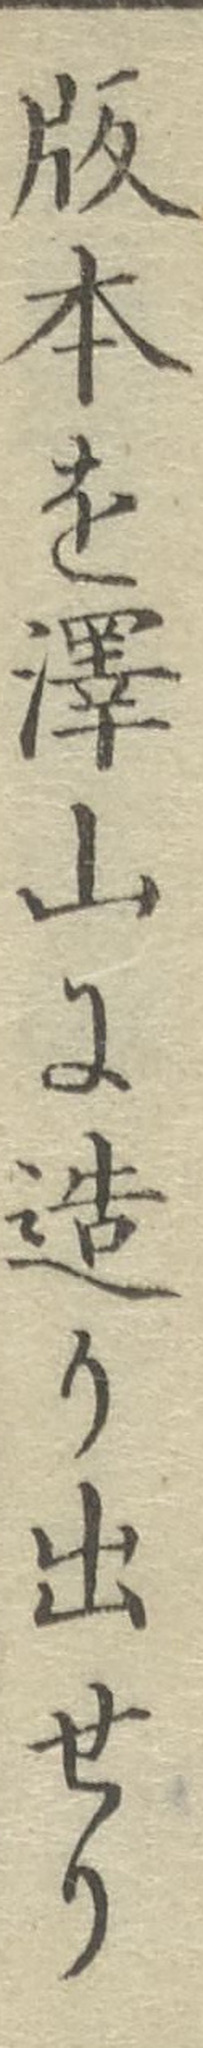版本を澤山に造り出せり
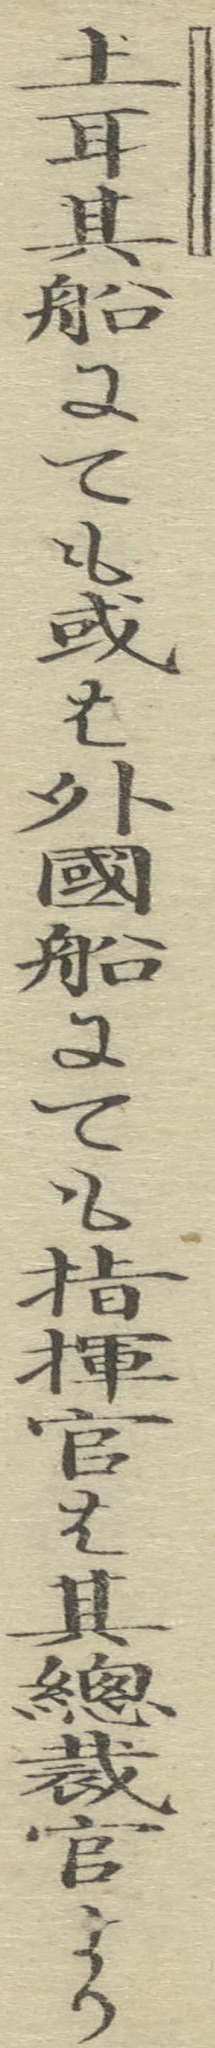土耳其船にても或は外國船にても指揮官は其總裁官より
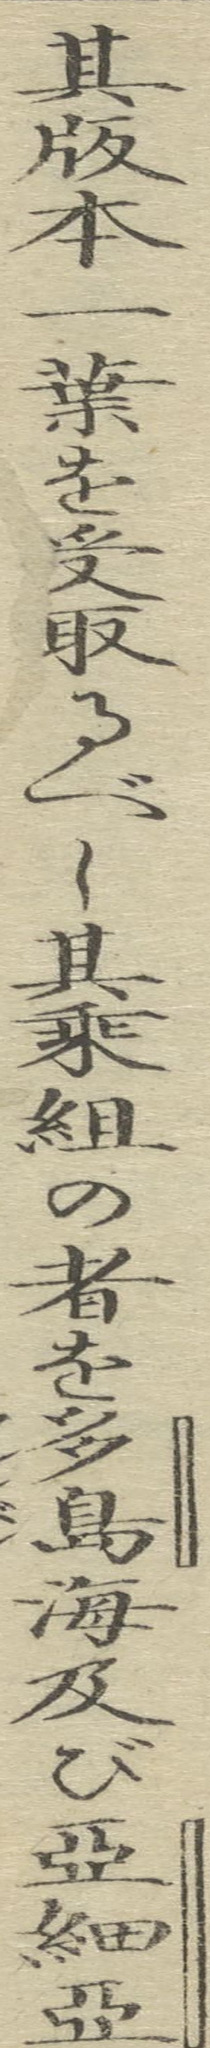其版本一葉を受取るべし其乗組の者を多島海及び亞細亞
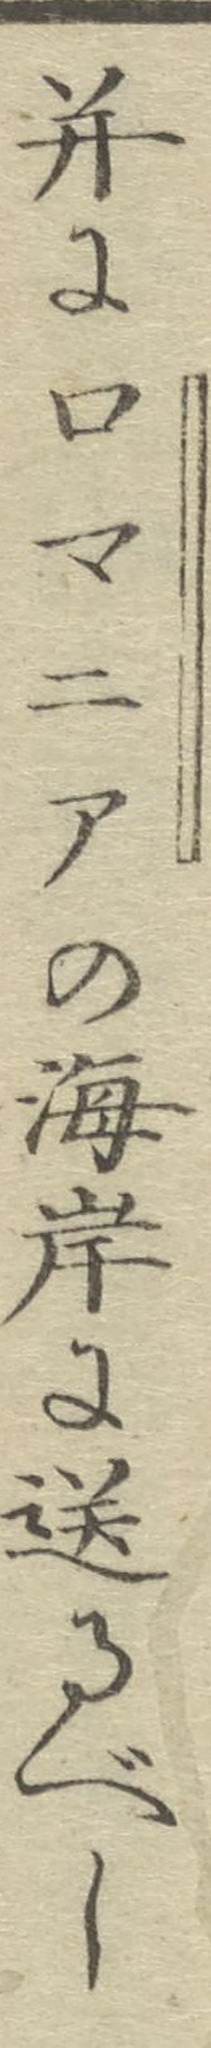并にロマニアの海岸に送るべし
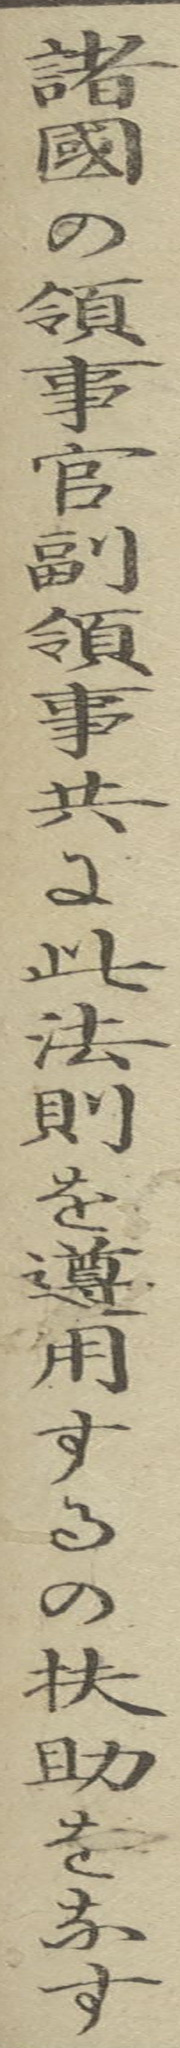諸國の領事官副領事共に此法則を遵用するの扶助をなす
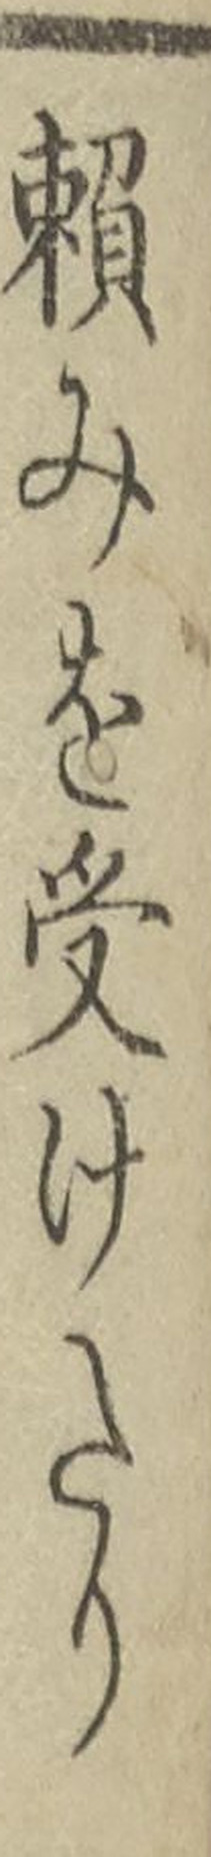頼みを受けたり
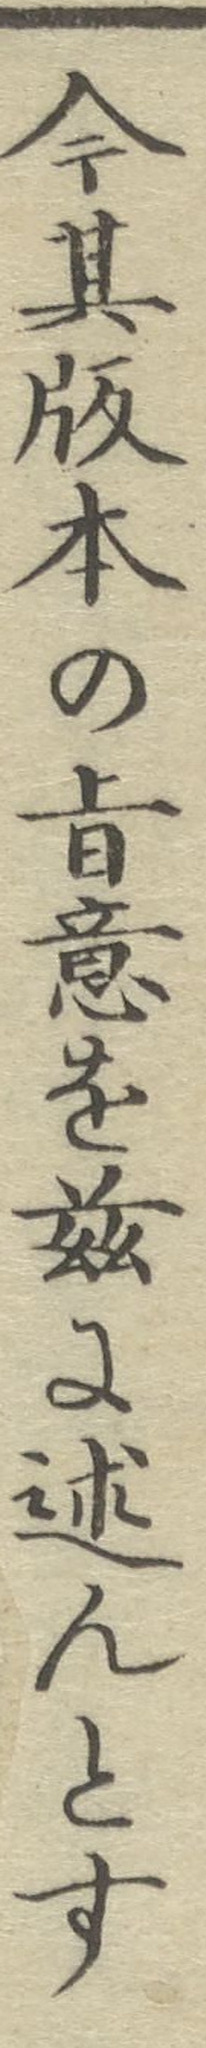今其版本の旨意を茲に述んとす
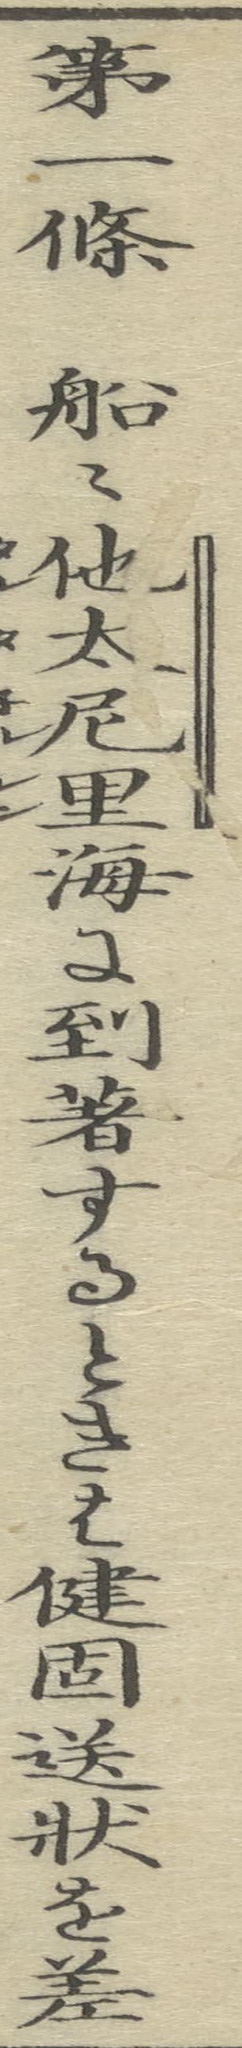第一條船々他太尼里に到着するときは健固送状を差
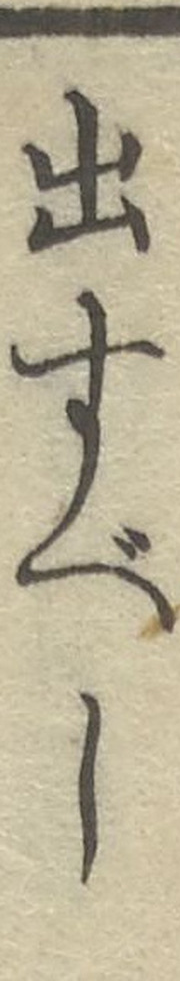出すべし
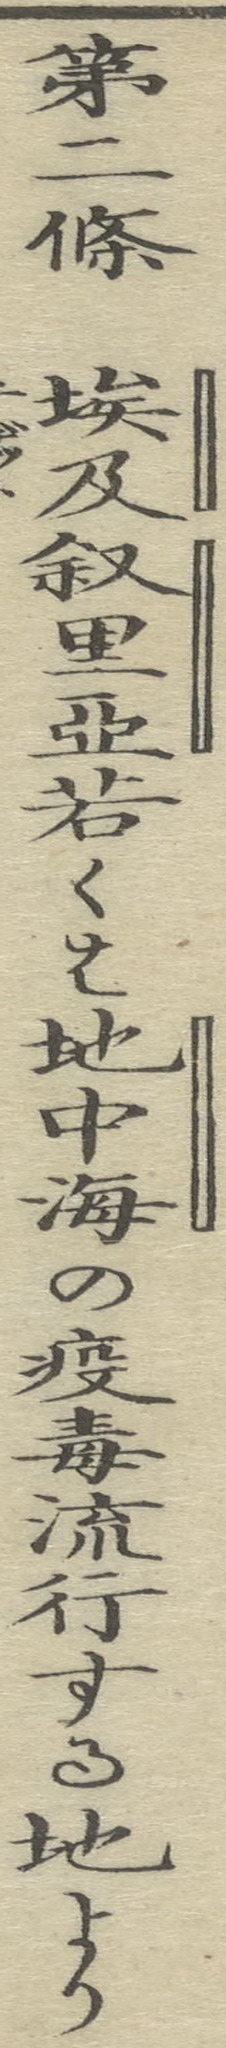第二條埃及叙里亞若くは地中海の疫毒流行する地より
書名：官版疫毒預防説　全
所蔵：東京大学総合図書館 General Library in the University of Tokyo, JAPAN
